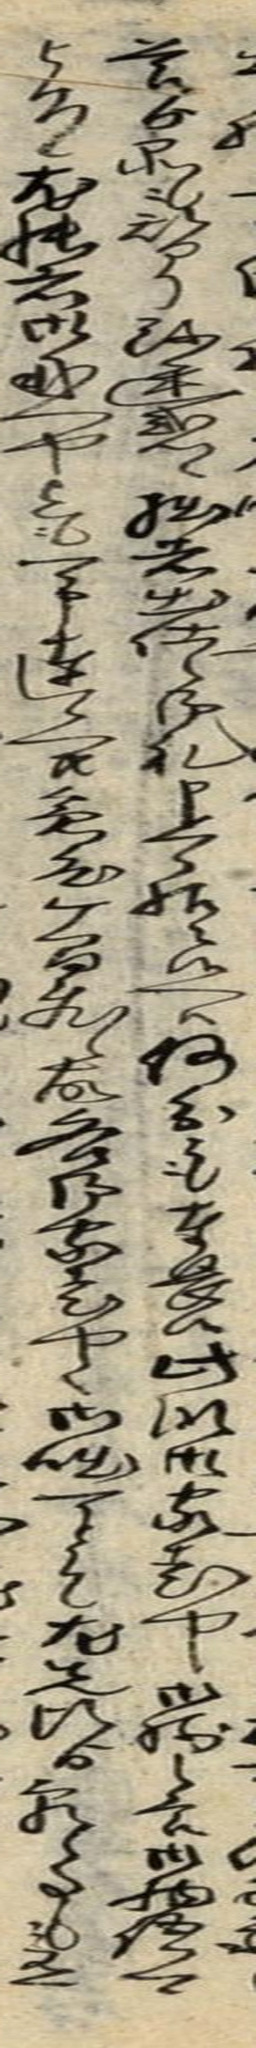被下候尤拙者御用人中迄も可申達候へ共急度ケ間敷候故各御家老中へ御咄可被下候尤先頃ゟ願之事も有
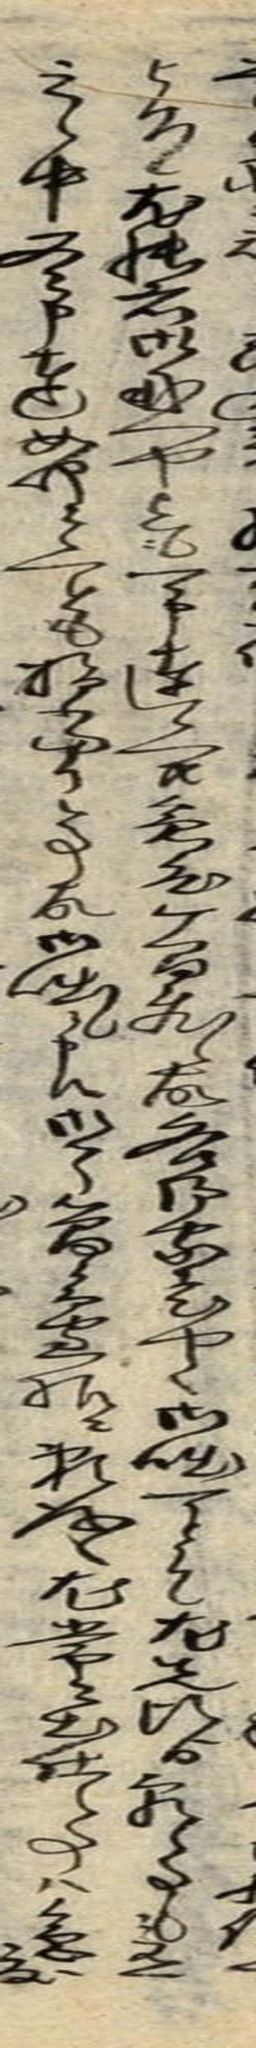之候中又々申達如何に候へとも指当り候事故御咄し申候御了簡に而宜様に頼存候尤常々出仕候事は急度
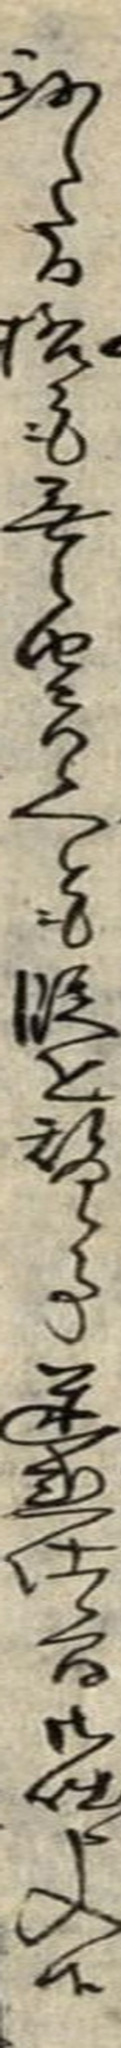致したる格にも無之由に候へとも聢と替候事迷惑仕候間御咄申入候
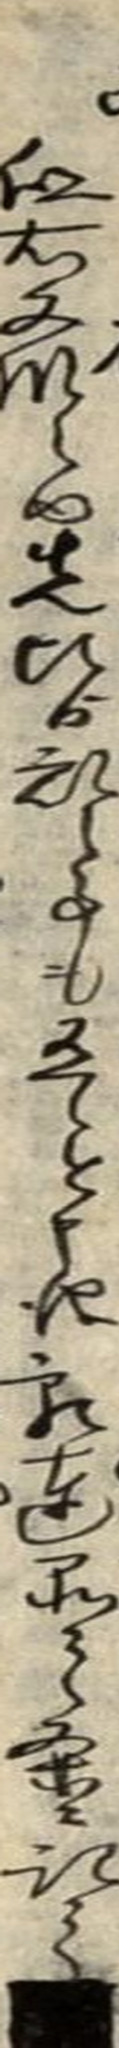但右文段之内先頃ゟ願之事も有之と申儀願達品々候条に記之
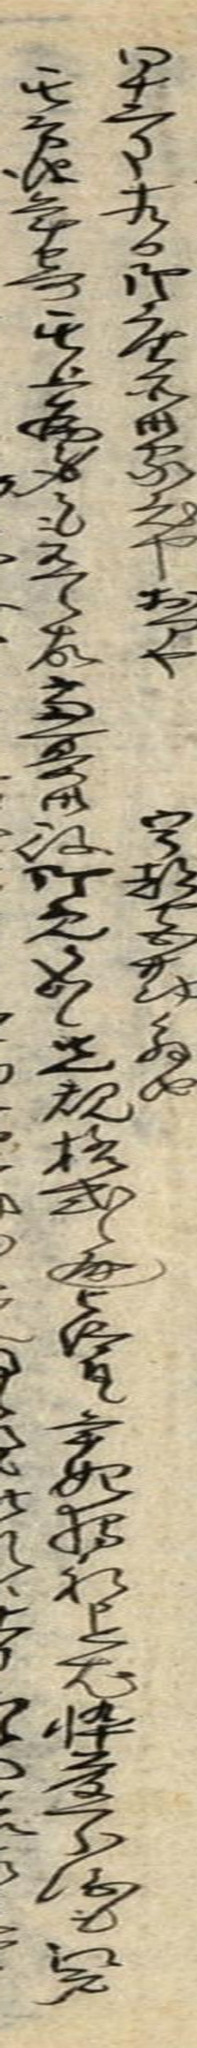其方儀年寄其上病身にも有之候故当夏御役御免被成候先規格式之通被仰付候年始独礼申上尤忰藤一郎儀も江戸
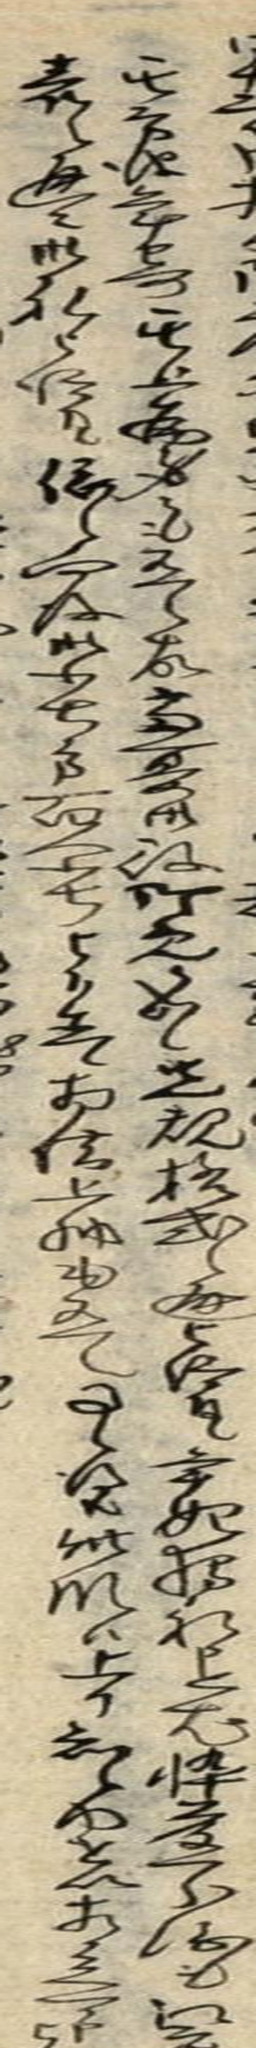表之通に御礼被仰付候依之向後御ふち方百人ふち被下置候拝借上納も有之候事に候得共此段は上り知之内を以相立可申旨
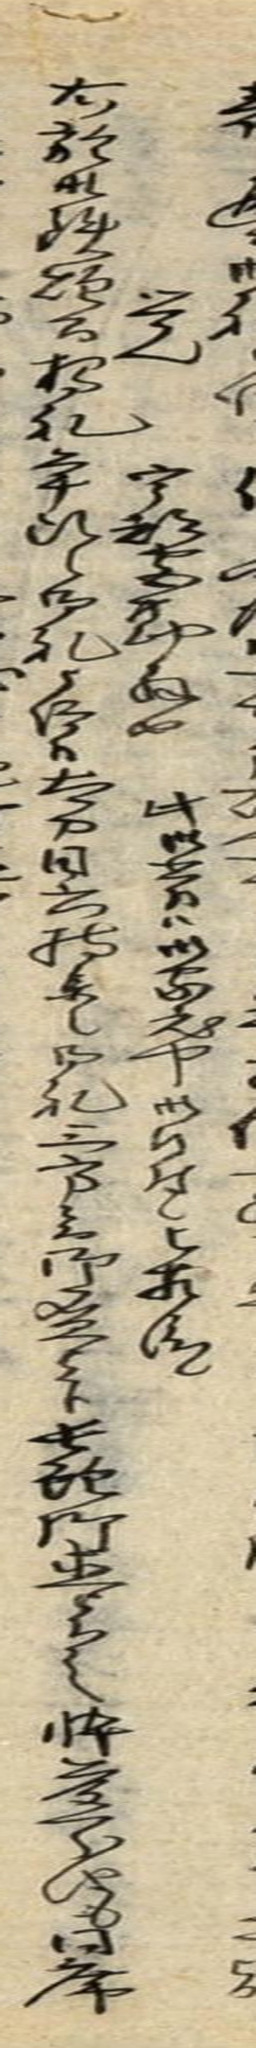右於鉄砲之間独礼年頭之御礼被仰付太刀目六持参之御礼三方に而御盃被下長蚫御直被下之忰藤一郎儀も同席
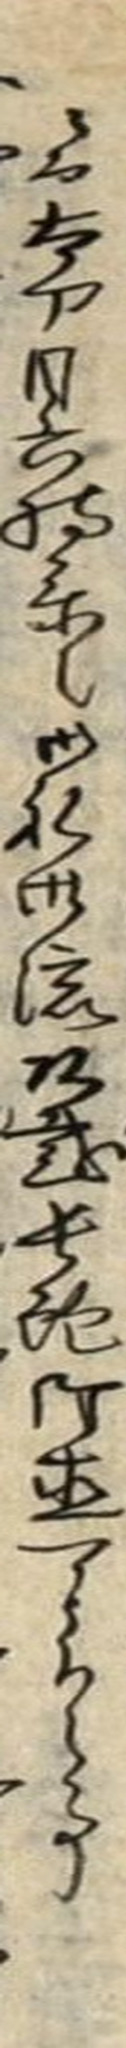に而太刀目六持参之御礼御流頂戴長蚫御直可被下候事
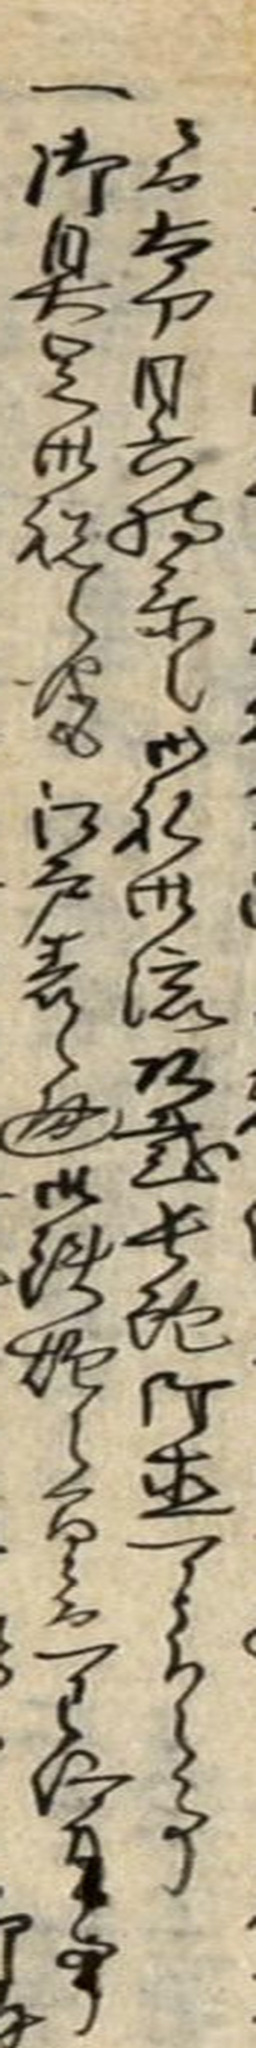一御具足御祝之儀も江戸表之通御鉄砲之間に而可被仰付候事
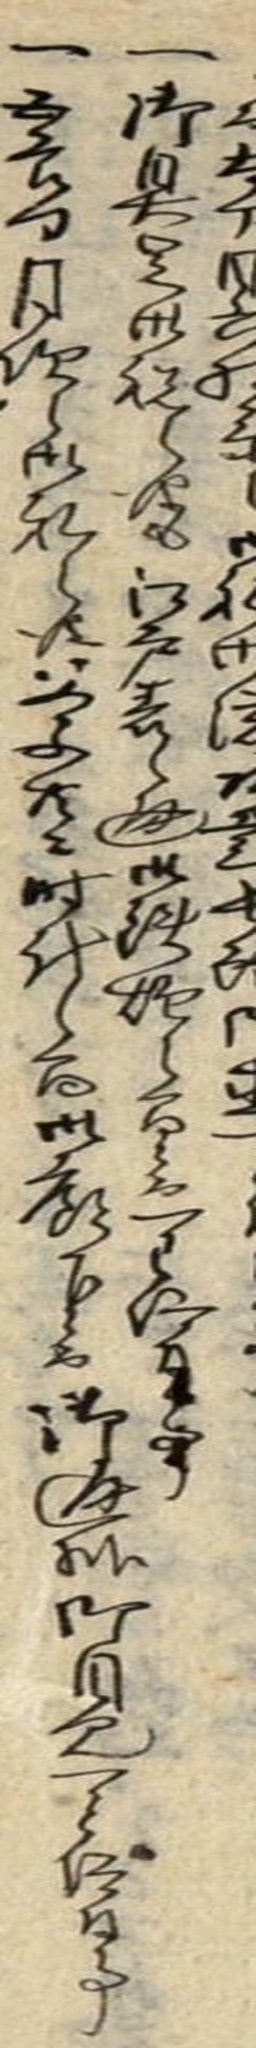一五節句月次之御礼之儀父子共に時計之間御廊下に而御通掛御目見可被仰付候事
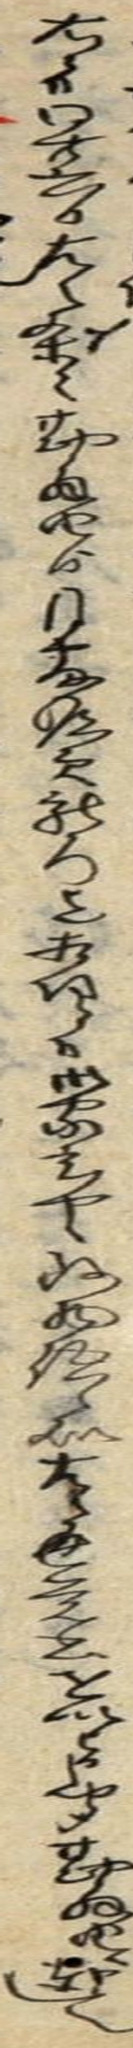右に付同廿六日左之条々勘解由ゟ月番渥美新右衛門迄相伺候に付御家老中へ致物語候処左之通覚書を以被申聞勘解由へ申達候也
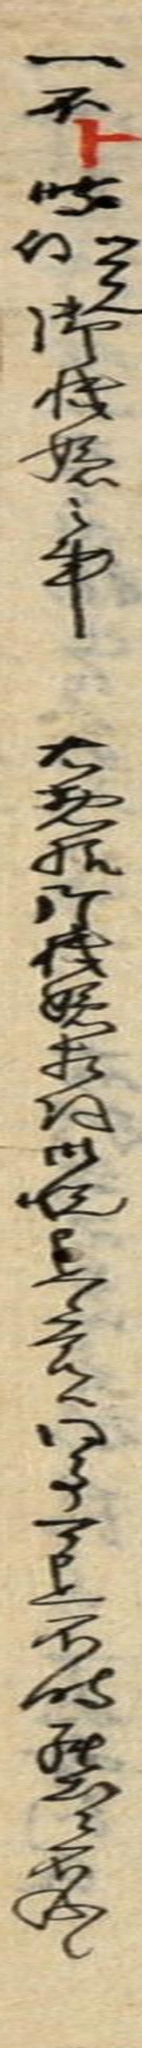一不時伺御機嫌之事右惣様御機嫌相伺御悦申上候節は同事可申上不時罷出に不及候

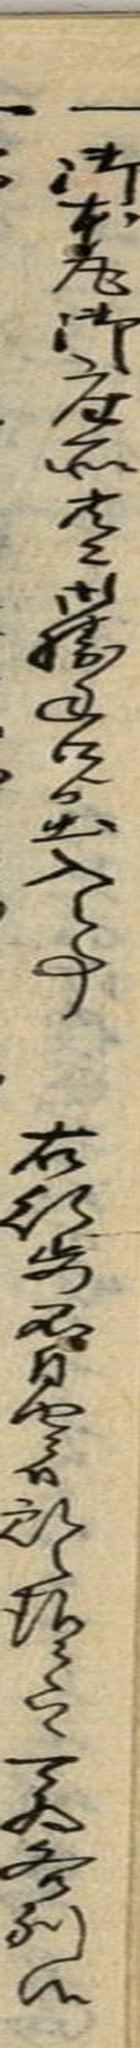一御本丸御座所共に御勝手口ゟ出入之事右行歩不自由に付願之趣に候はゝ可為各別候
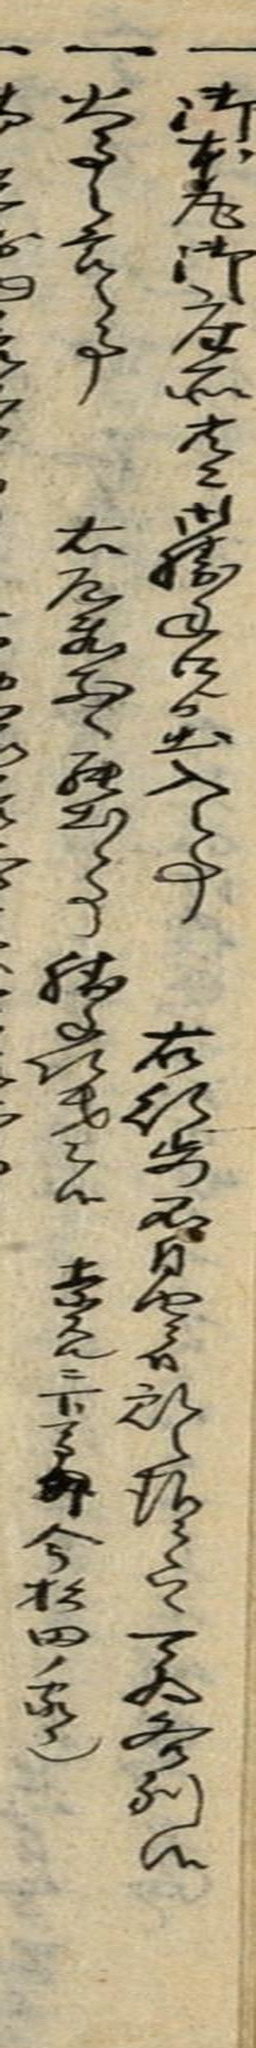一火事之節之事右屋敷前へ罷出候事勝手次第に候案するに下馬外今杉田ノ家也
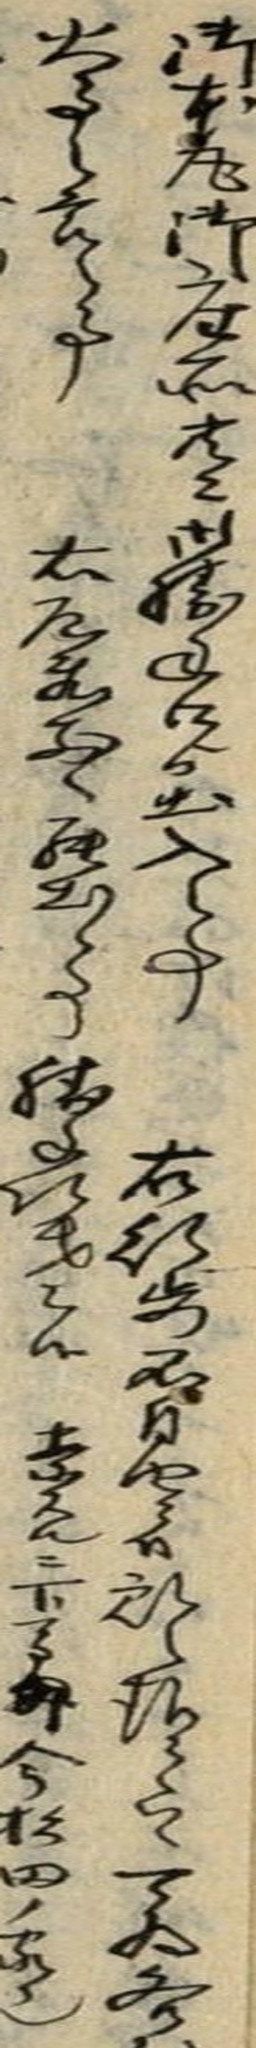一火事之節之事右屋敷前へ罷出候事勝手次第に候案するに下馬外今杉田ノ家也
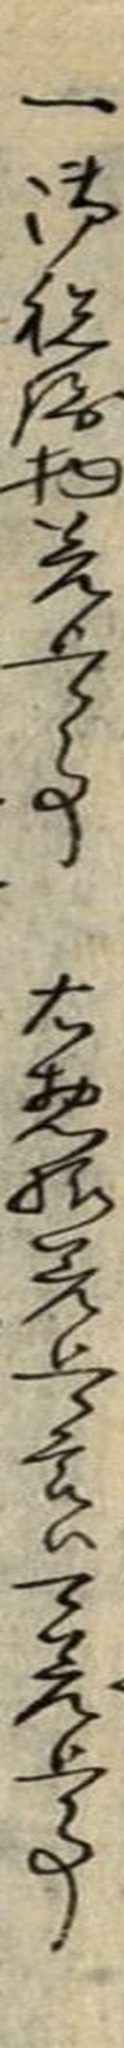一御祝儀物差上候事右惣様差上候節は可差上候事
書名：御用并被仰出之部
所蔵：福井県文書館 Fukui Prefectural Archives
